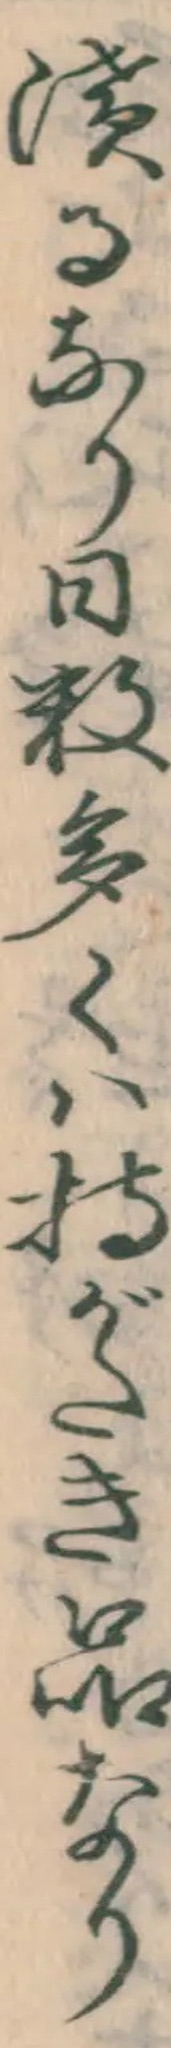漬るなり日数多くは持がたき品なり
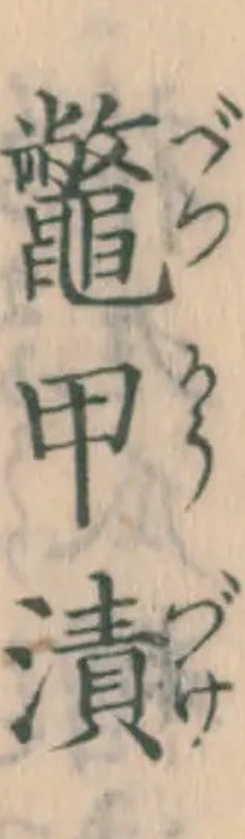鼈甲漬
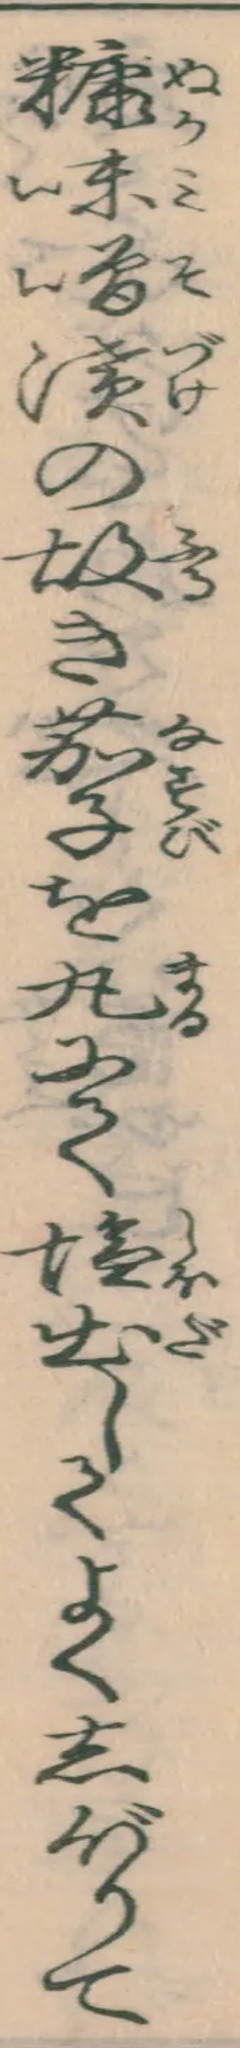糠味噌漬の故き茄子を丸にて塩出してよくしぼりて
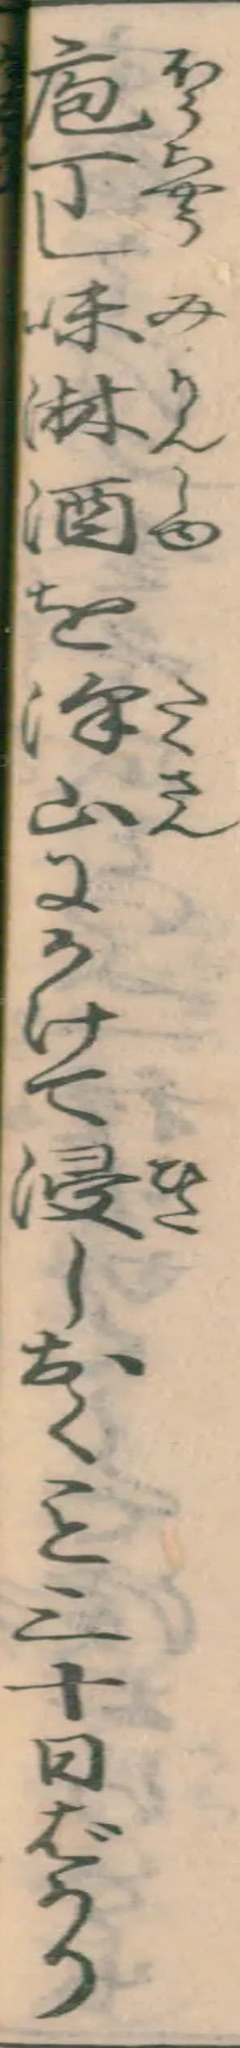庖丁し味淋酒を沢山にかけて浸しおくこと三十日ばかり
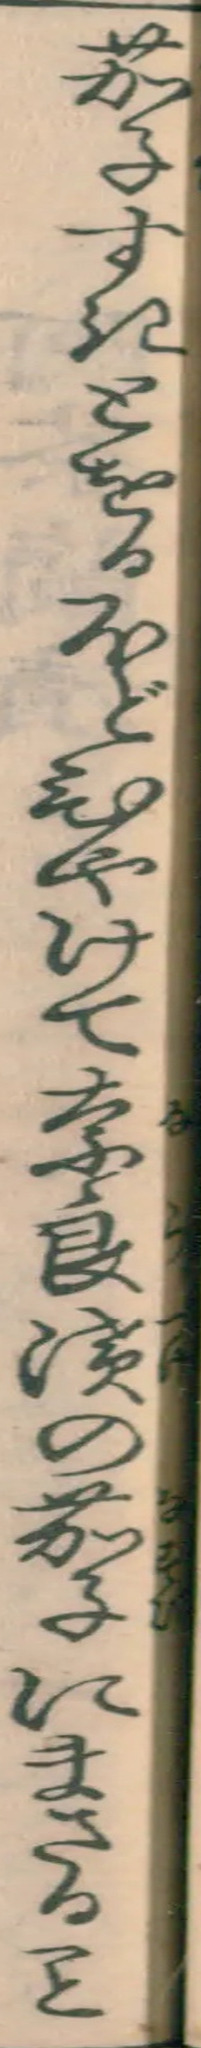茄子すきとをるほどひやけて奈良漬の茄子にまさること
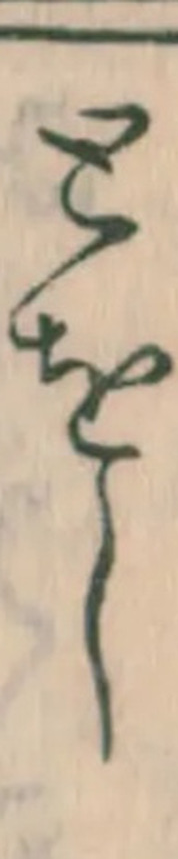とをし
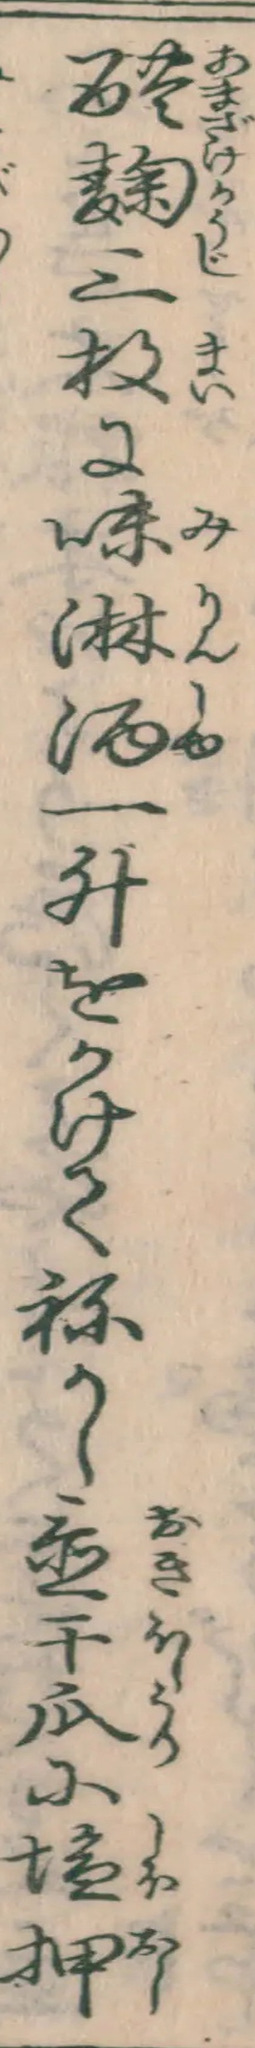醴麹三枚に味淋酒一升をかけてねかし置干瓜に塩押
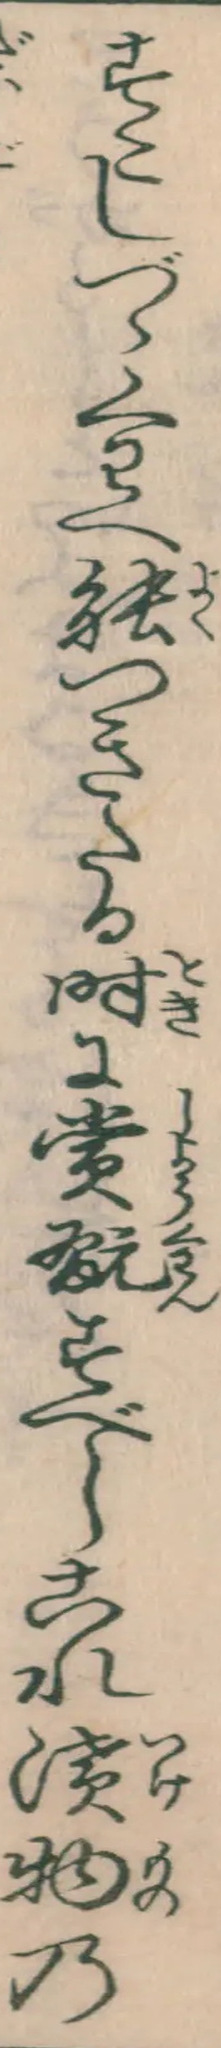すこしづゝくわへ能つきたる時に賞翫すべしこれ漬物の
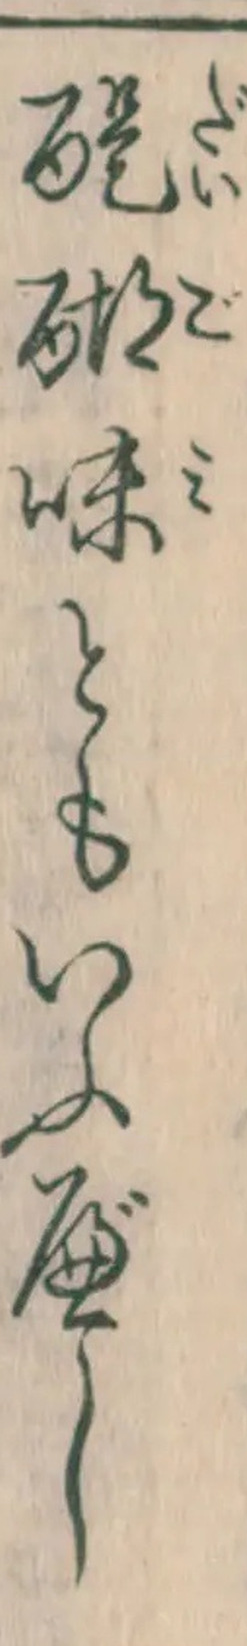醍醐味ともいふべし
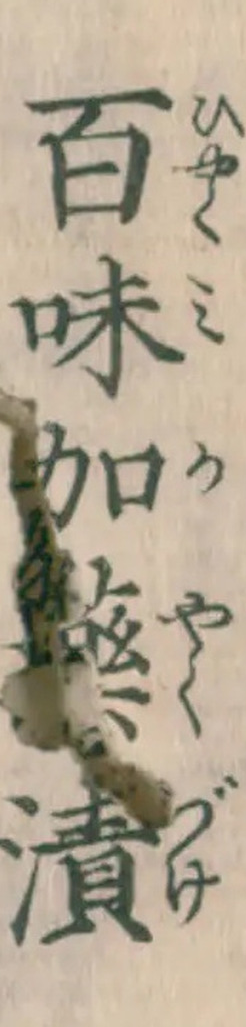百味加薬漬
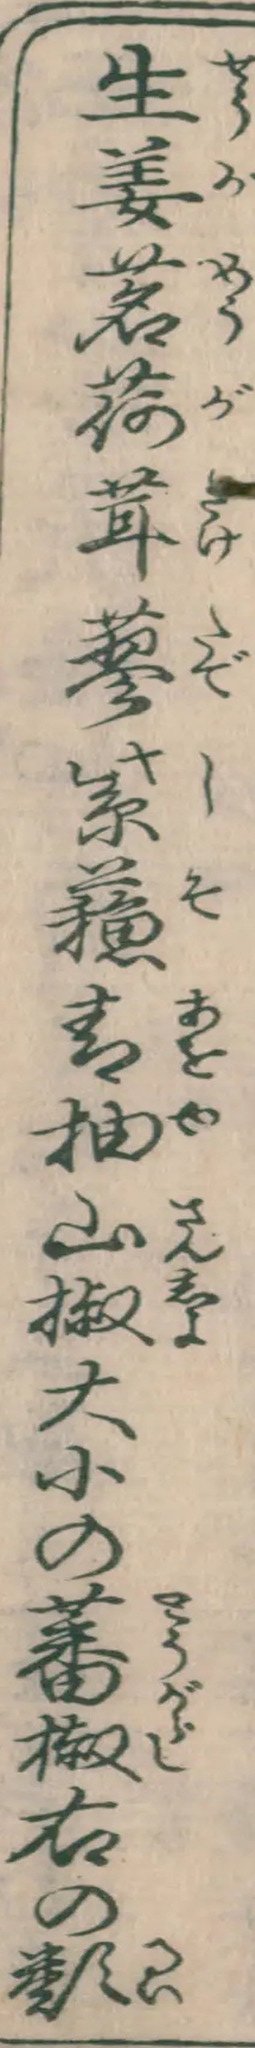生姜茗荷茸蓼紫蘇青柚山椒大小の蕃椒右の類

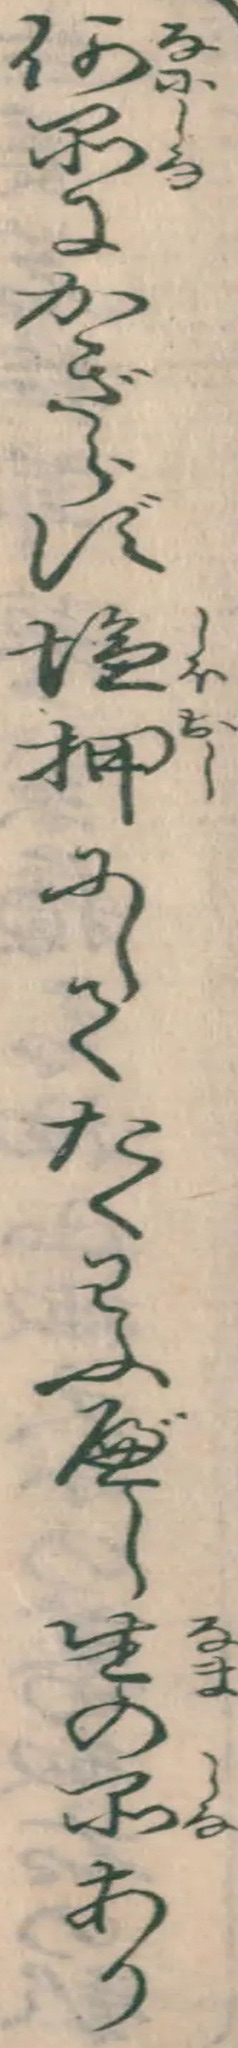何品にかぎらず塩押にしてたくわふべし生の品あり
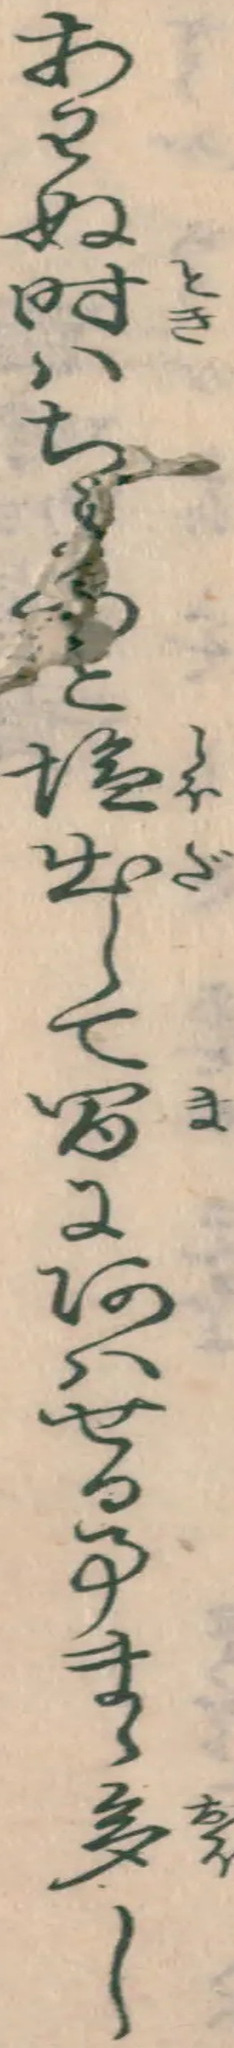あわぬ時はちよつと塩出して間にあはせる事まゝ多し
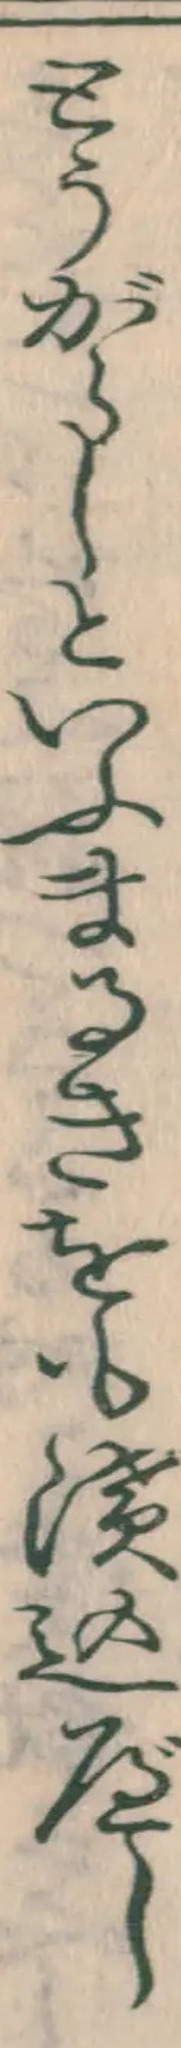とうがらしといふまるきをも漬込べし
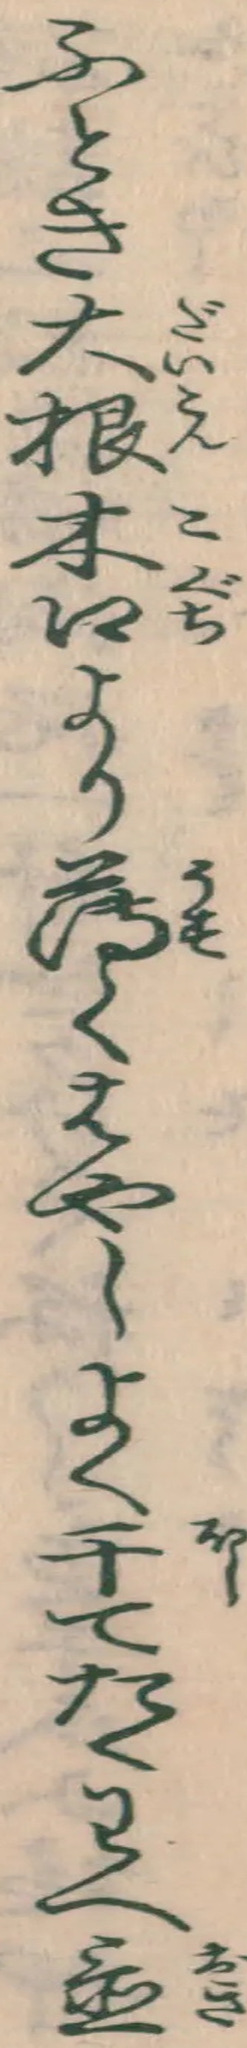ふとき大根木口より薄くはやしよく干てたくわへ置
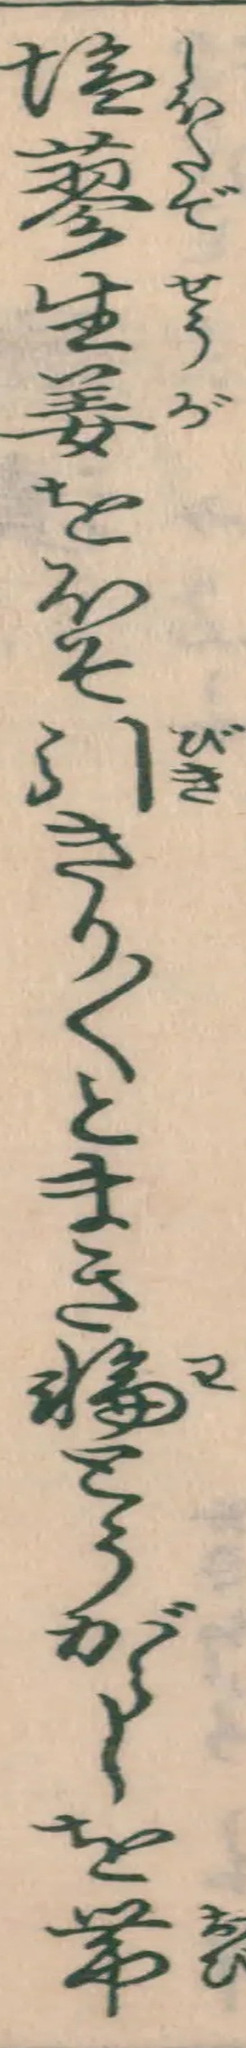塩蓼生姜をほそ引きり〳〵とまき輪とうがらしを帯
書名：四季漬物鹽嘉言
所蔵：国立国会図書館 National Diet Library, JAPAN
